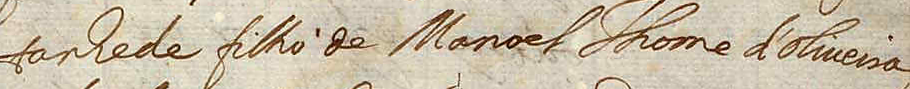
tanhede filho de Manoel Thome d´Oliveira,
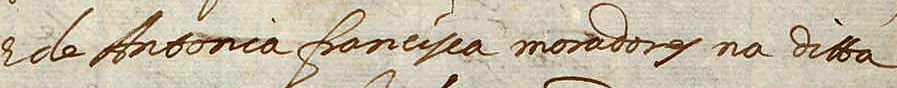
e de Antonia Francisca moradores na ditta
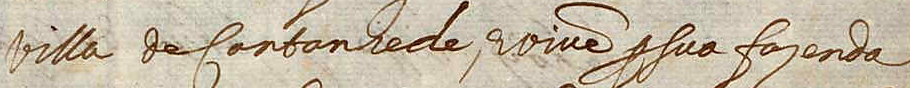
villa de Cantanhede, e vivem pera sua fazenda
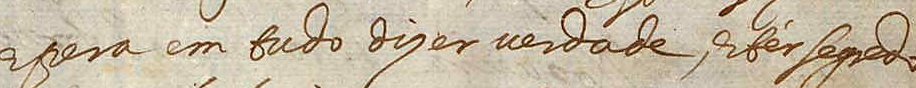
e pera , e em tudo dizer verdade, e tér segredo
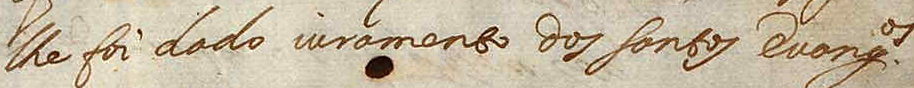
lhe foi dado iuramento dos Santos Evang.os
